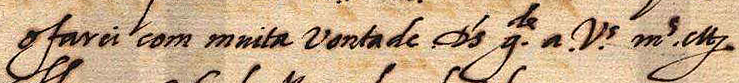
o farei com muita vontade Ds̄ g.de a V.s m.s ettꝭ
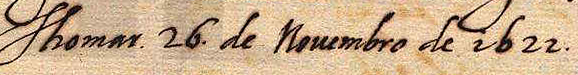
Thomar. 26. de Nouembro de 1622.
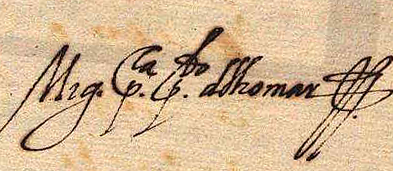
Mig. p.ra p.do d thomar
